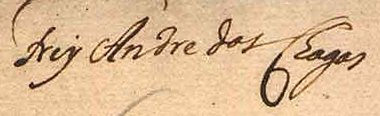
Frey Andre das Chagas
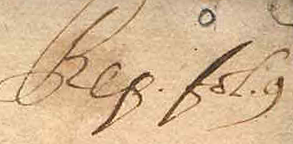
Rep. fol. 9
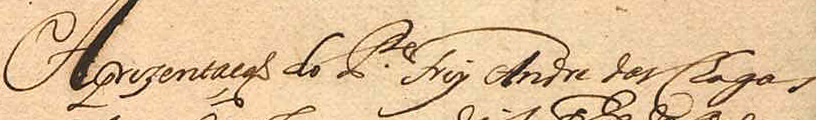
Aprezentaçaõ do P.e Frey Andre das Chagas
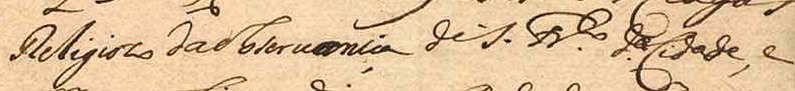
Religiozo da obseruancia de S. Fr.co da Cidade, e
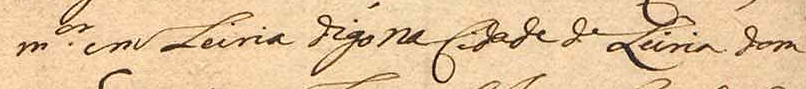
m.or em Leiria digo na Cidade de Leiria dom
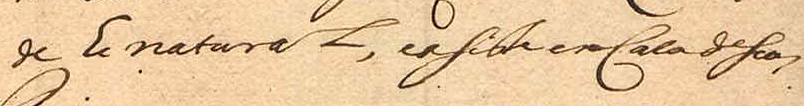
de he naturaL, e asiste em Caza de seos
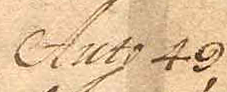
Auto 49
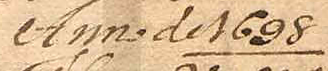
Anno de 1698
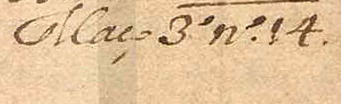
Maço 3o n.o 14.
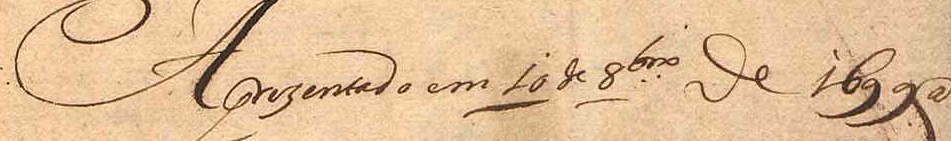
Aprezentado em i0 de 8.bro de i699 ā
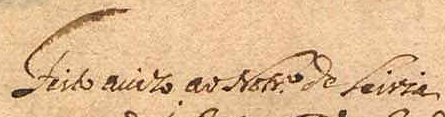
Feito auizo ao Notr.o de leiria
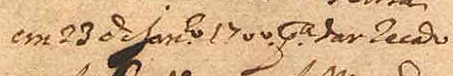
em 23 de Jan.ro 1700 p.a dar Recado
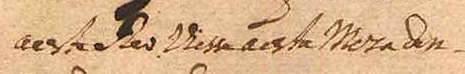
a este Reo Viesse a esta Meza den
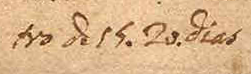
tro de 15. 20. dias
